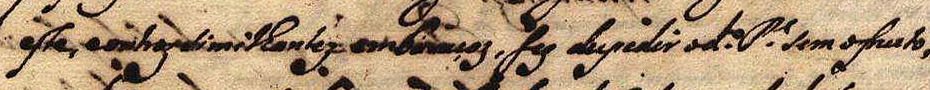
este, e outroz similhantes embaraçoz, fez despedir o d̄.o P.e sem o fruto,
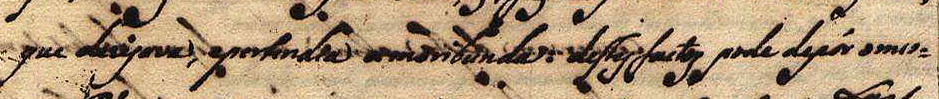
que dezejava, e pertendia a moribunda destes factoz pode depór o mes
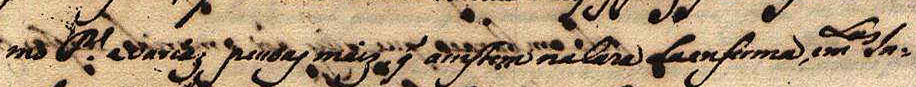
mo P.e a variaz pessoas maiz q̄ assistem na Caza da enferma, e m.tas In
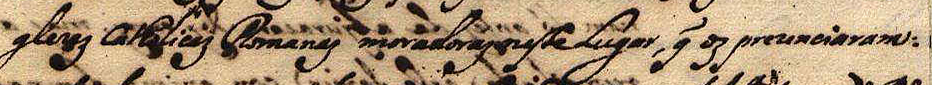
glezaz Catholicaz Romanaz moradoraz neste Lugar, q̄ oz prezenciaram
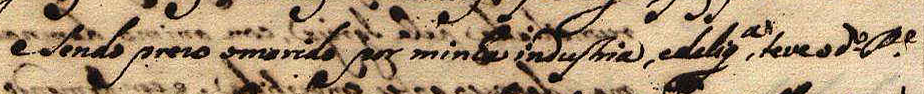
e sendo prezo o marido por minha industria, e delig.as, teve o d.o P.e
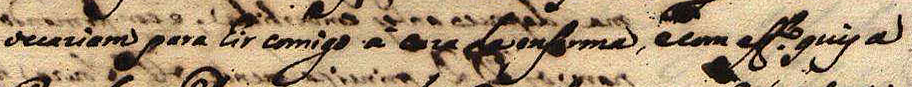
occaziam para hir comigo a caza da enferma, e com eff.to quis a
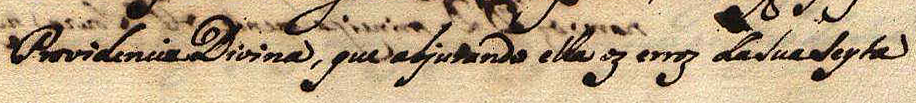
Providencia Divina, que abjurando ella oz erroz da Sua Seyta
